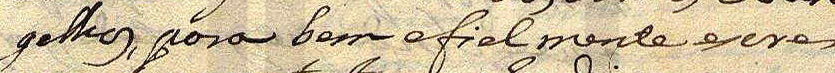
gelhos, para bem e fielmente escre
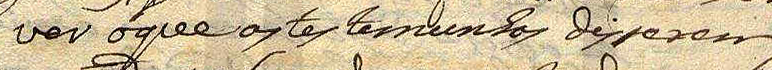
ver o que as testemunhas disseren
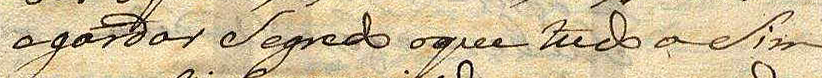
e gardar Segredo o que tudo aSim
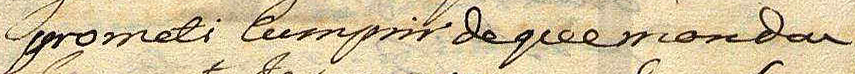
prometi cumprir de que mandou
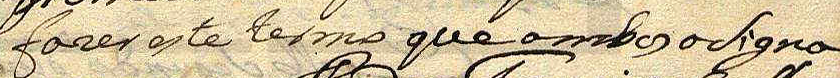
fazer este termo que ambos aSigna
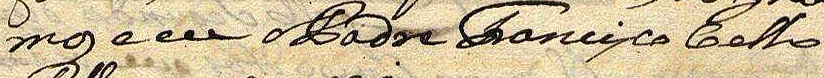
mos e eu o Padre Francisco Coelho
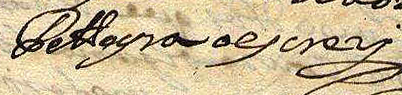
Petteyra o escrevj
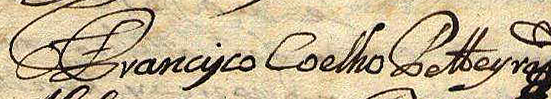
Francisco Coelho Petteyra
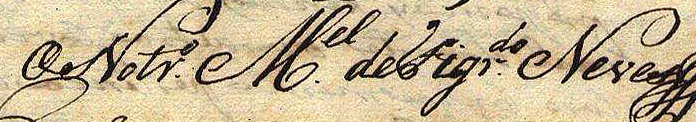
O Notr.o M.el de Figr.do Neves
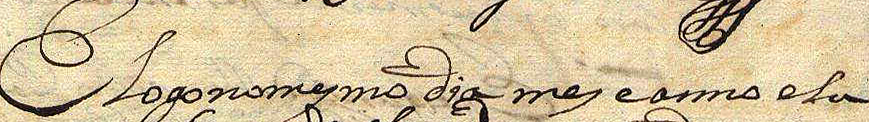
E Logo no mesmo dia mes e anno e lu
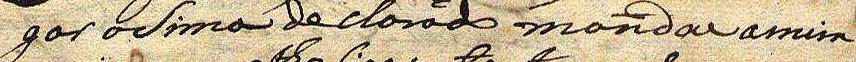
gar aSima declarado mandou a mim
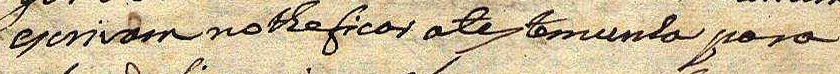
escrivam notheficar a testemunha para
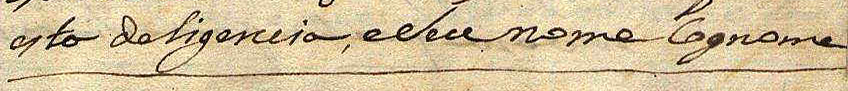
esta deligencia, e seu nome cognome
